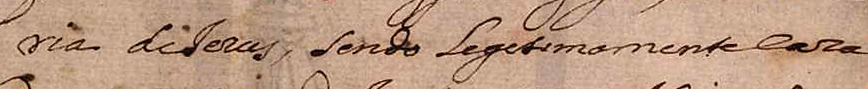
ria de Iezus, sendo Legitimamente caza
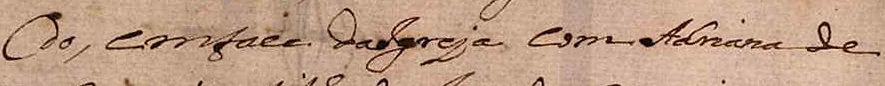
do, em face da Igreja com Adriana de
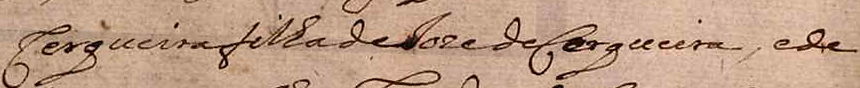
Cerqueira filha de Ioze de Cerqueira, e de
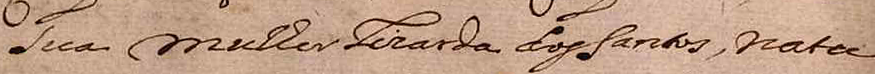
sua mulher Lizarda dos santos, natu
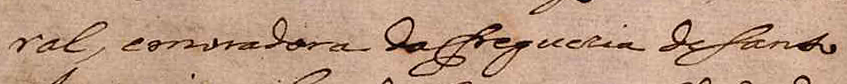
ral, e moradora da freguezia de santo
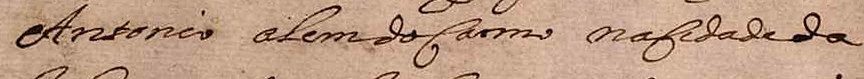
Antonio alem do Carmo na Cidade da
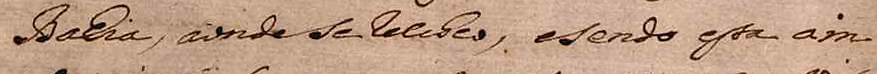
Bahia, aonde se Recebeo, e sendo esta ain
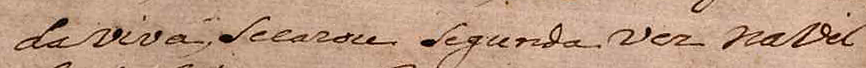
da viva, se cazou segunda vez na Vil
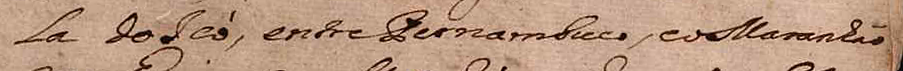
la do Icò, entre Pernambuco, e o Maranhaõ
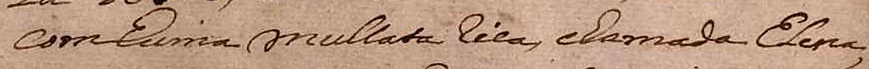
com huma mullata Rica, chamada Elena
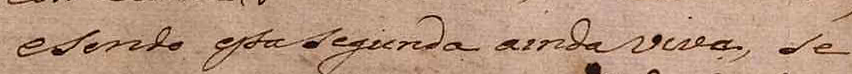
e sendo esta segunda ainda viva, se
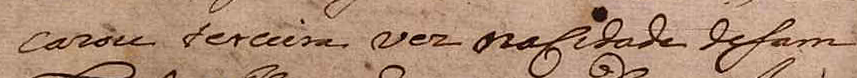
cazou terceira vez na Cidade de sam
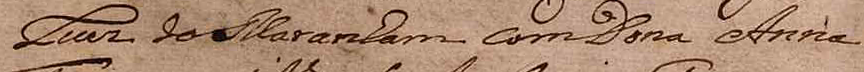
Luiz da Maranham com Dona Anna
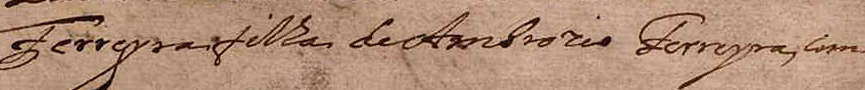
Ferreyra filha de Ambrozio Ferreyra, com
